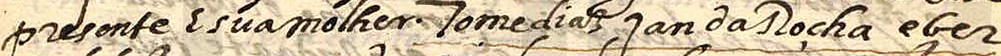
presente E sua molher. Tome dias Jan da Roçha e ber
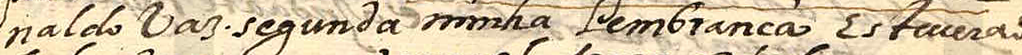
naldo Vaz. segunda minha lembrança Esteueraõ
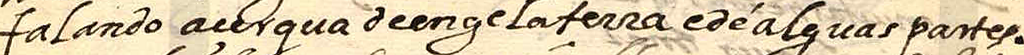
falando açerqua de engelaterra e de alguas partes
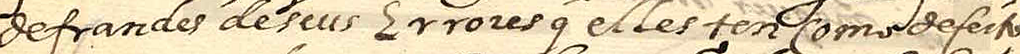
de frandes de seus Errores q̄ elles ten Como defeito
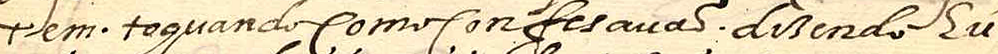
tem. toquando Como Confesauaõ. dizendo hū
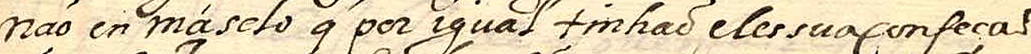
naõ en māselo q̄ por igual tinhaõ eles sua Confeçaõ
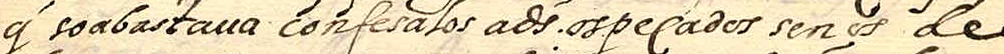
q̄ so abastaua confesalos a ds̄. os peCados sen os de
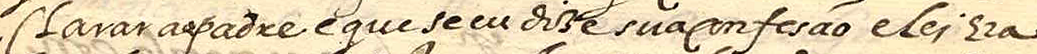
Clarar ao padre e que se eu dize sua Confesão e Lei Era
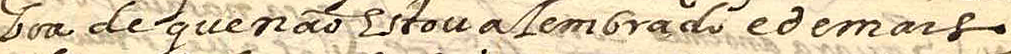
boa de que não Estou alembrado e de mais
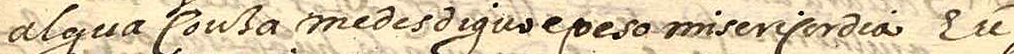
algua Couza me desdiguo e peso misericordia Eū
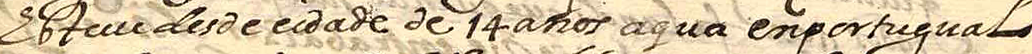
Esteue desde eidade de 14 anos aqua en portuguaL
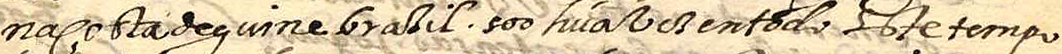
na Costa de guine brazil. soo hūa vez en todo Este tempo
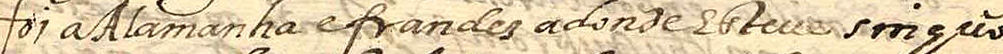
foi a Alamanha e frandes adonde Esteue sinquo
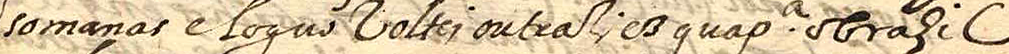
somanas e loguo Voltei outra Vez qua pa. o brazil
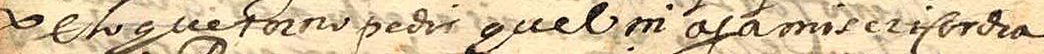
pelo que torno pedir que Vm. aja miseriCordia
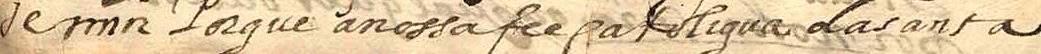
de min Porque a nossa fee Catoliqua da santa
